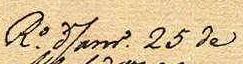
R.o đ Janr.o 25 de
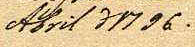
Abril đ 1796.
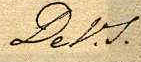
De V. S.
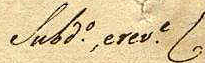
Subd.o, e rev.e C.
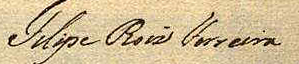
Filipe Roiz̄ Ferreira
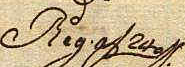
Reg.da a f 240
